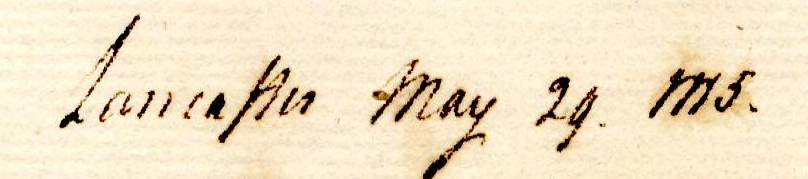Lancaster May 29. 1775.
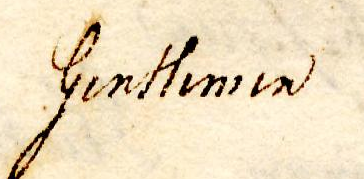Gentlemen
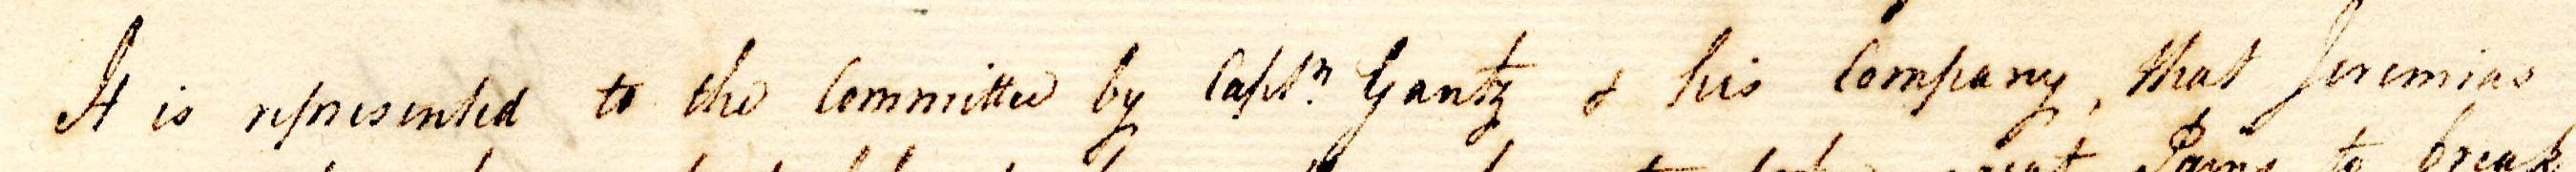It is presented to the Commitee by Capt^n. Gantz & his Company, that Jeremias
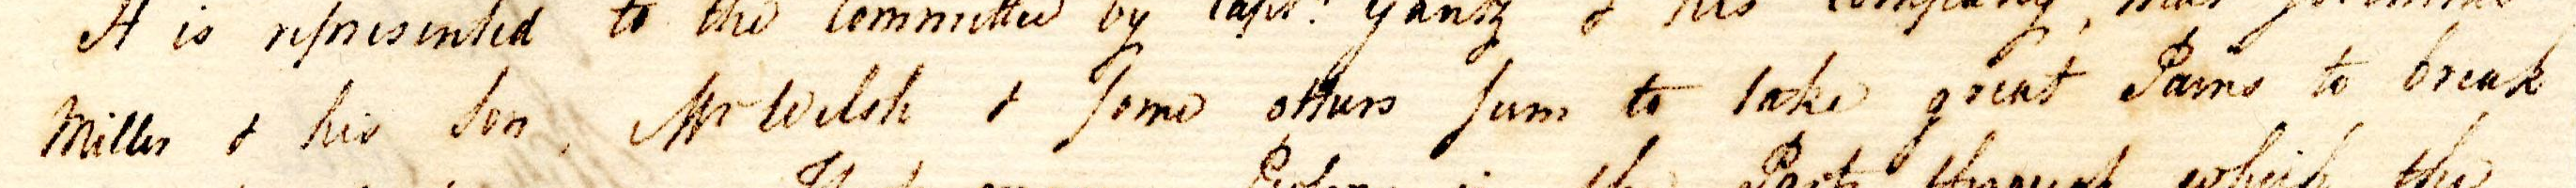Miller & his Son M^r Welsh & some others seem to take great Pains to break
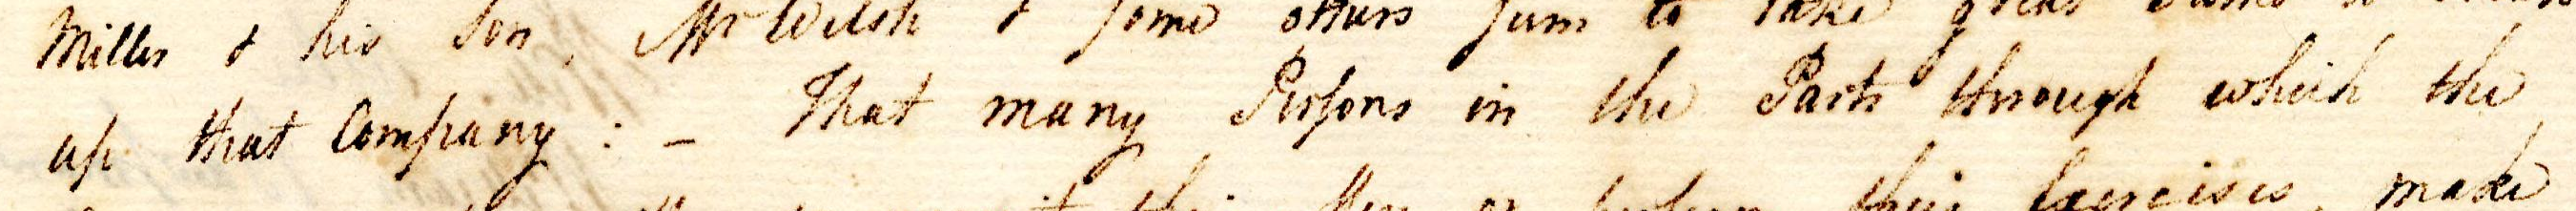up that Company:- That many Persons in the Parts through which the
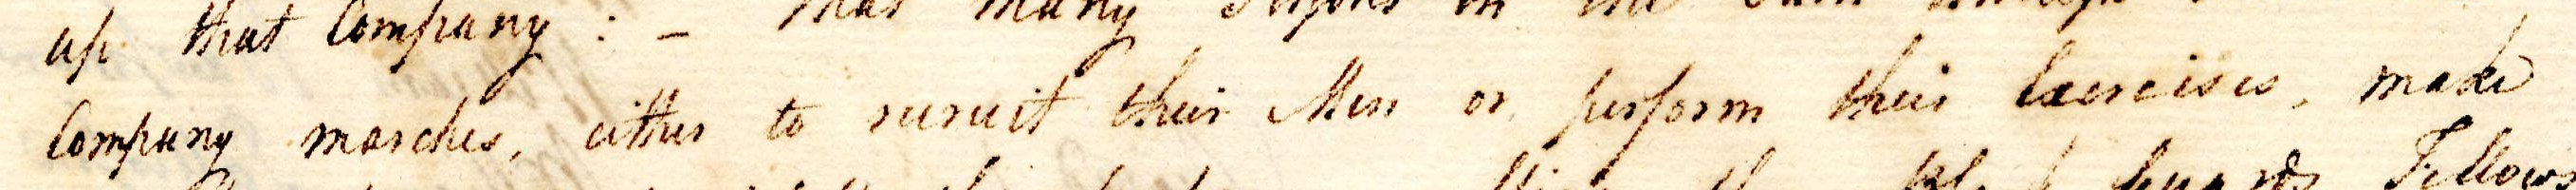Company marches, either to suruit their Men or perform their Exercises make
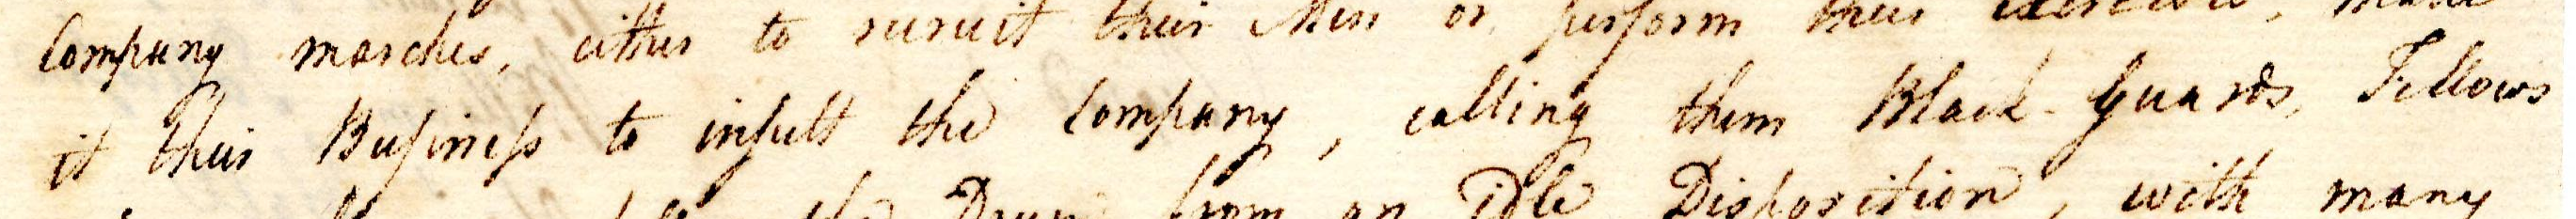it their Bufiness to insult the Company, calling them Black Guards, Fellows
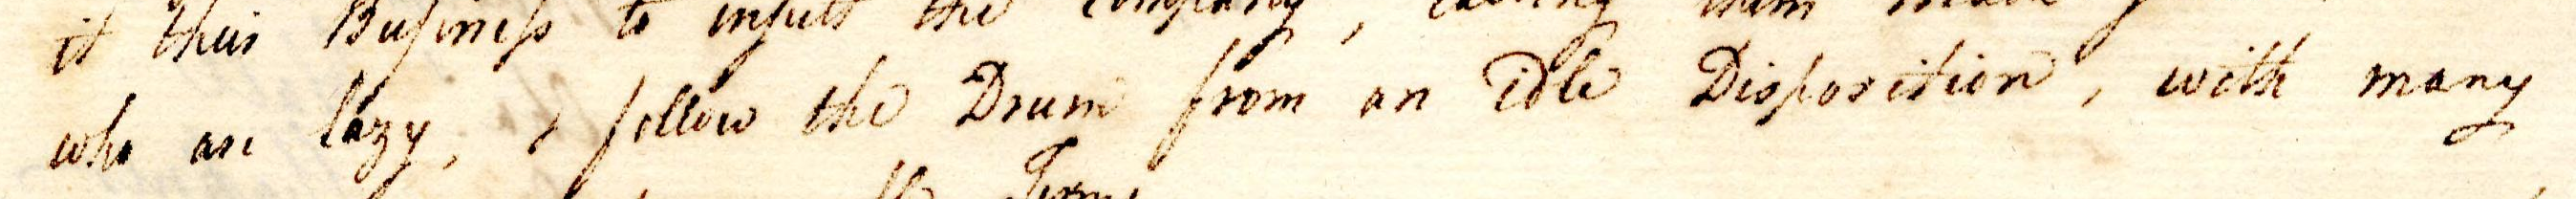who are lazy follow the Drum from an idle Disposition, with many
